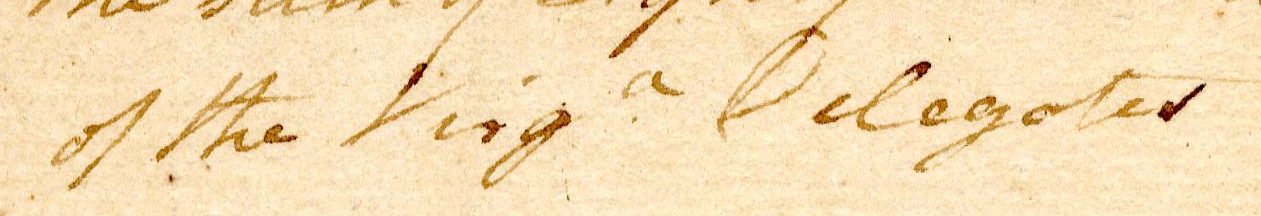of the Virg^a. Delegates
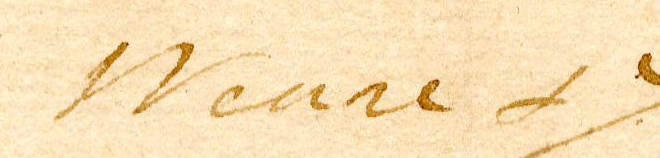Weare &^c
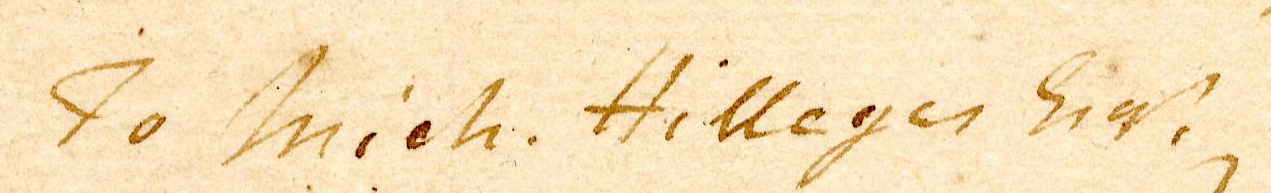to Inrich. Hillagas Esq^r.
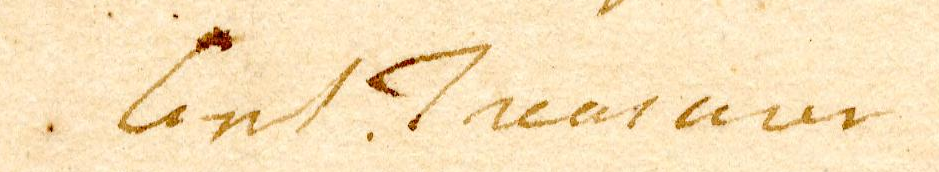Genl. Treasurer
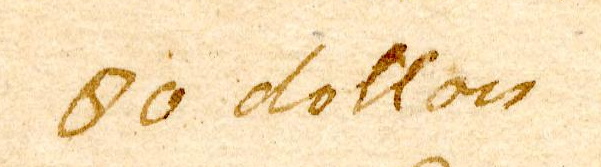80 dollars
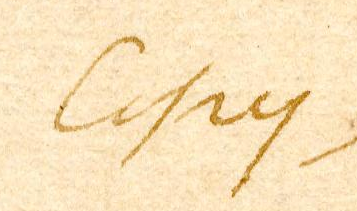Copy
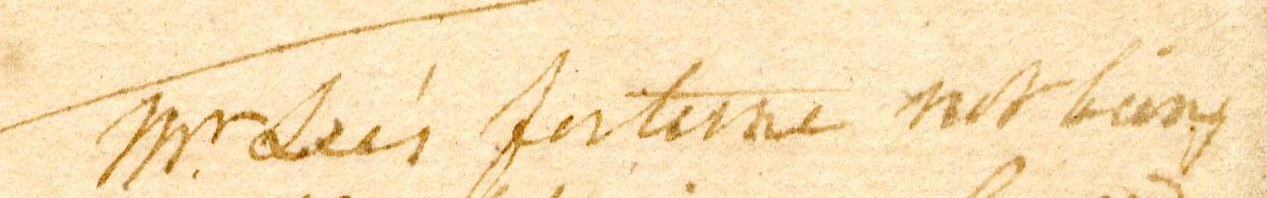M^r. Lees fortune not being
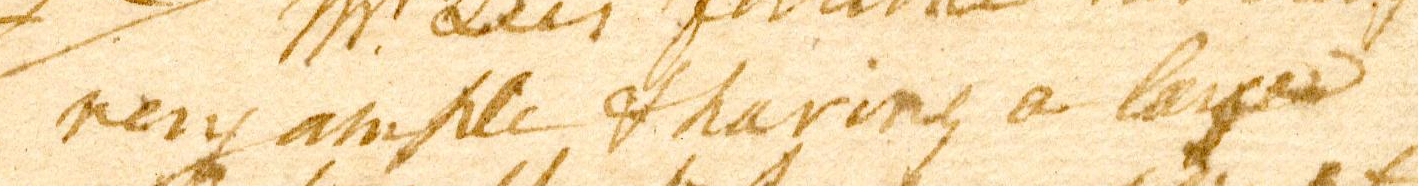very ample & having a large
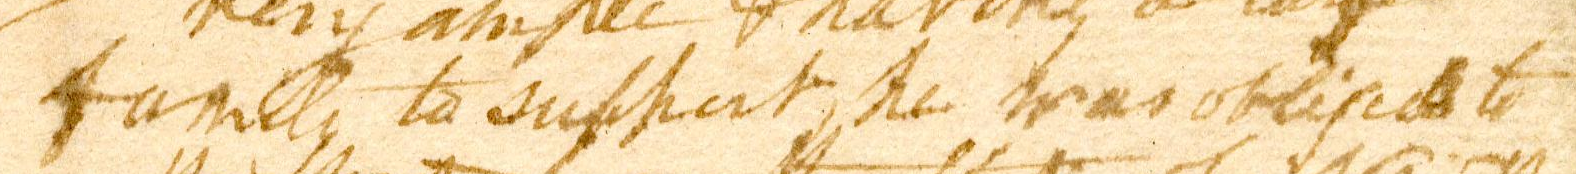family to support, he was oblige to
